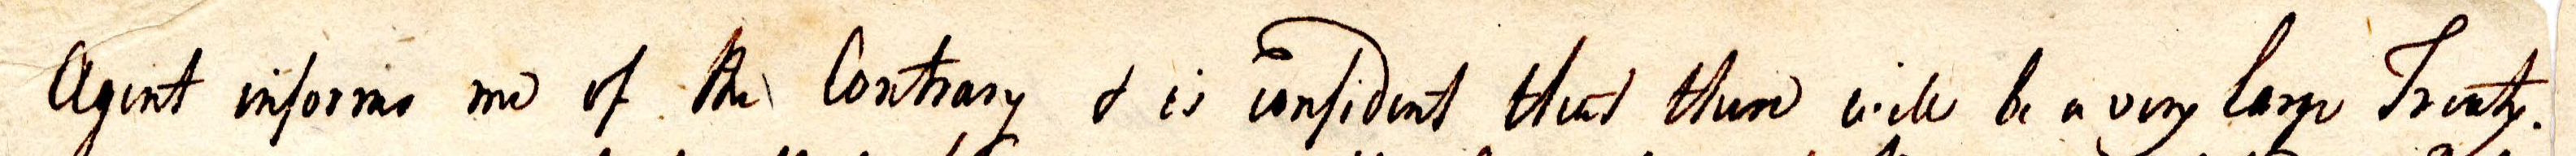Agent informs me of the Contrary & is confident that there will be a very large Treaty.
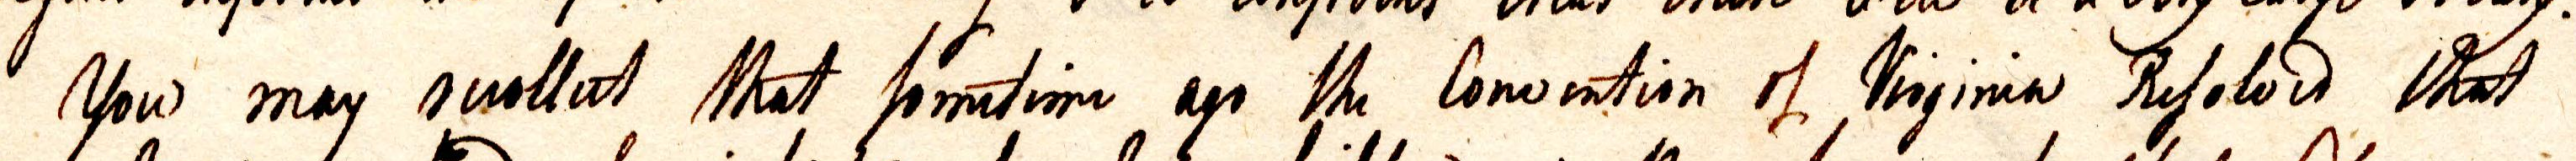You may recollect that sometime ago the Convention of Virginia Resolved that
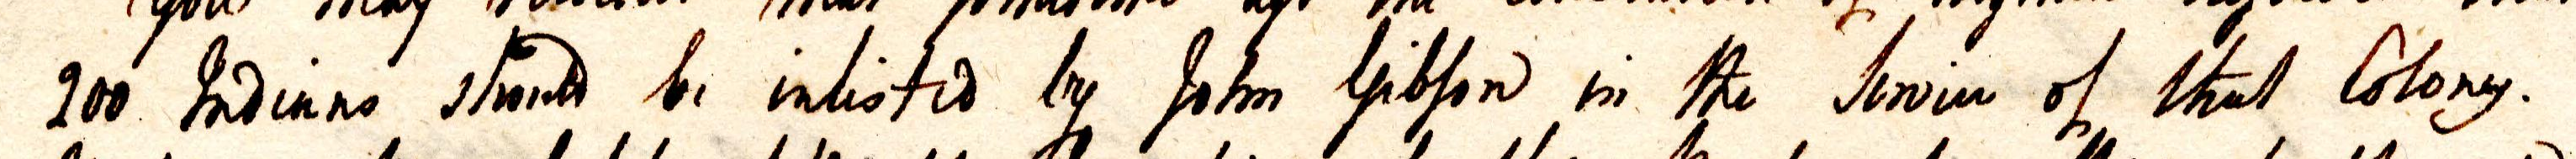200 Indians should be inlisted by John Gibson in the Service of that Colony.
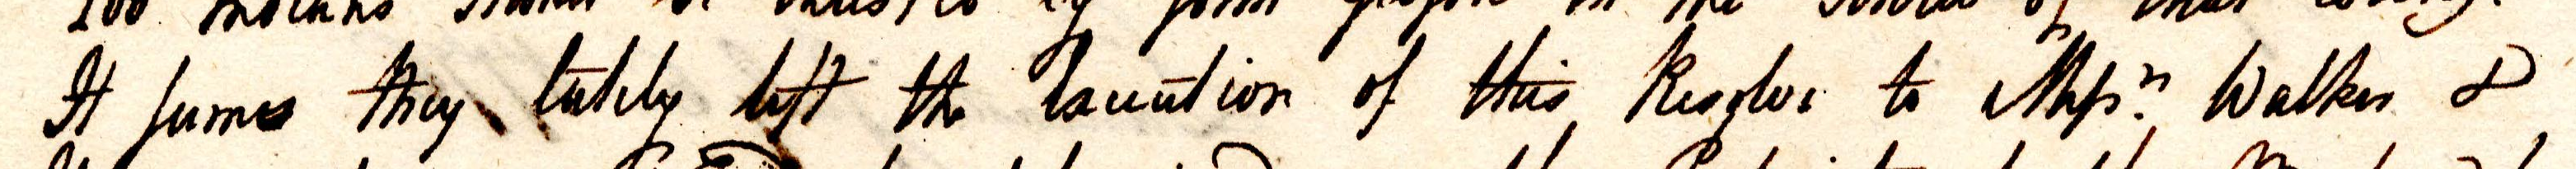It seems they lately left the Execution of this Resolve to Maj^rs. Walker &
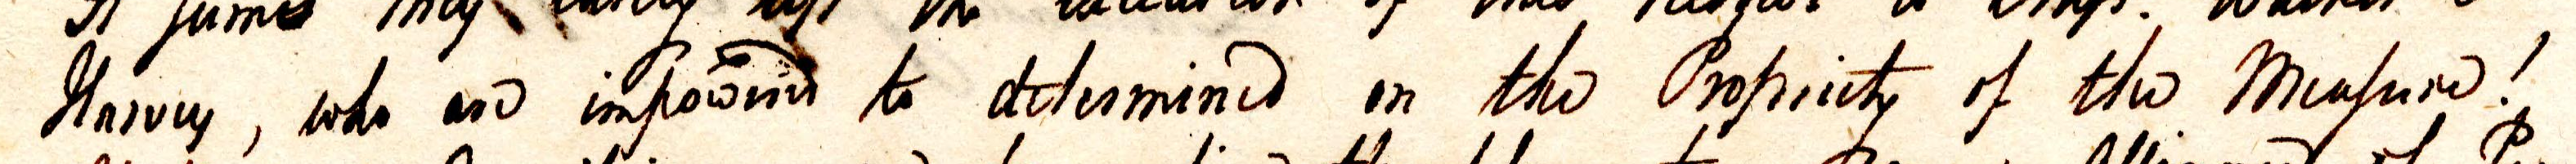Harvey, who are impowered to determined on the Propriety of the Measure!
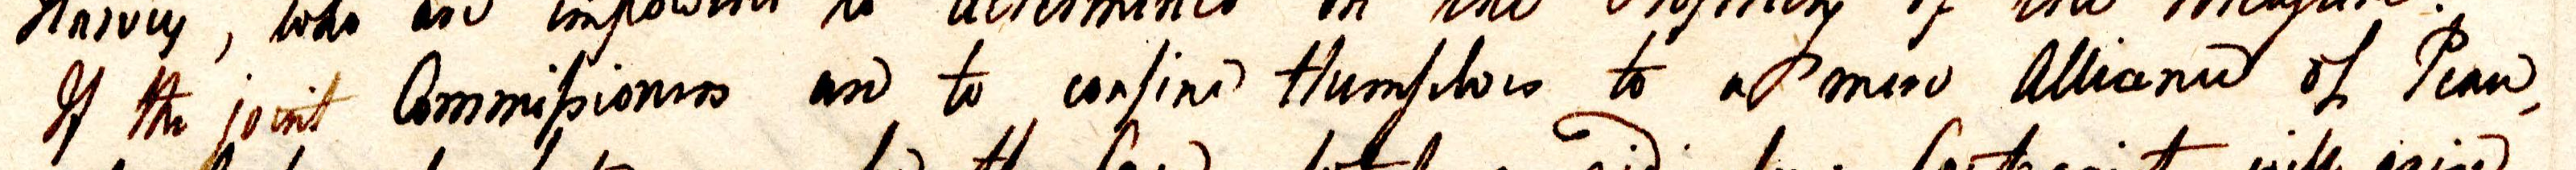If the joint Commissioners are to confine themselves to a mere alliance of Penn,
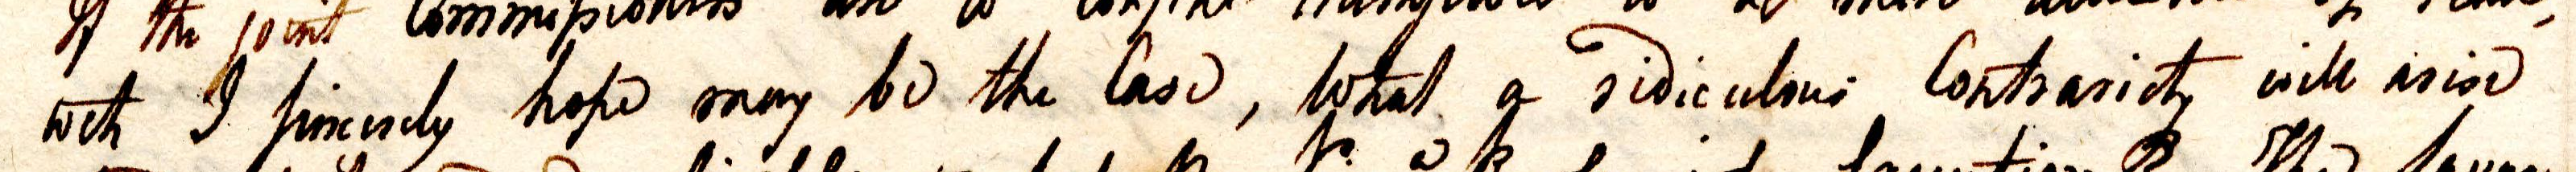wch I sincerely hope may be the Case, what a ridiculous Contrarity will arise
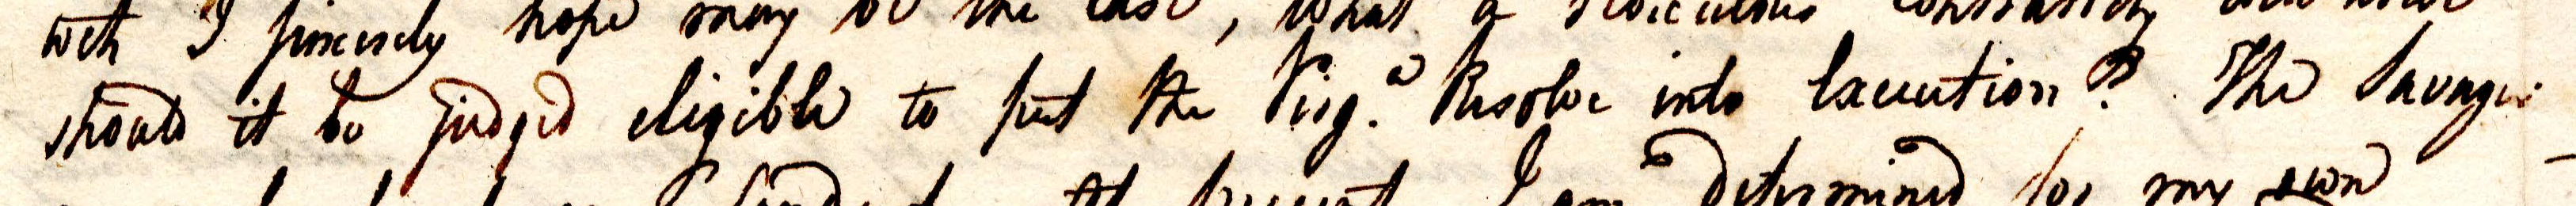should it be judged eligible to put the Virg^a. Resolve into Execution? The Savages
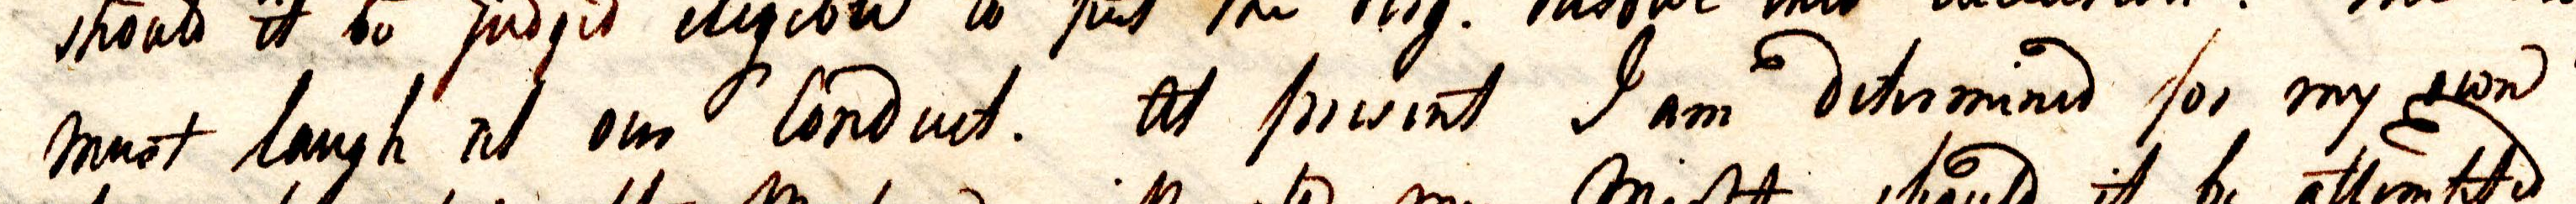must laugh at our Conduct. At present I am determined for my own
